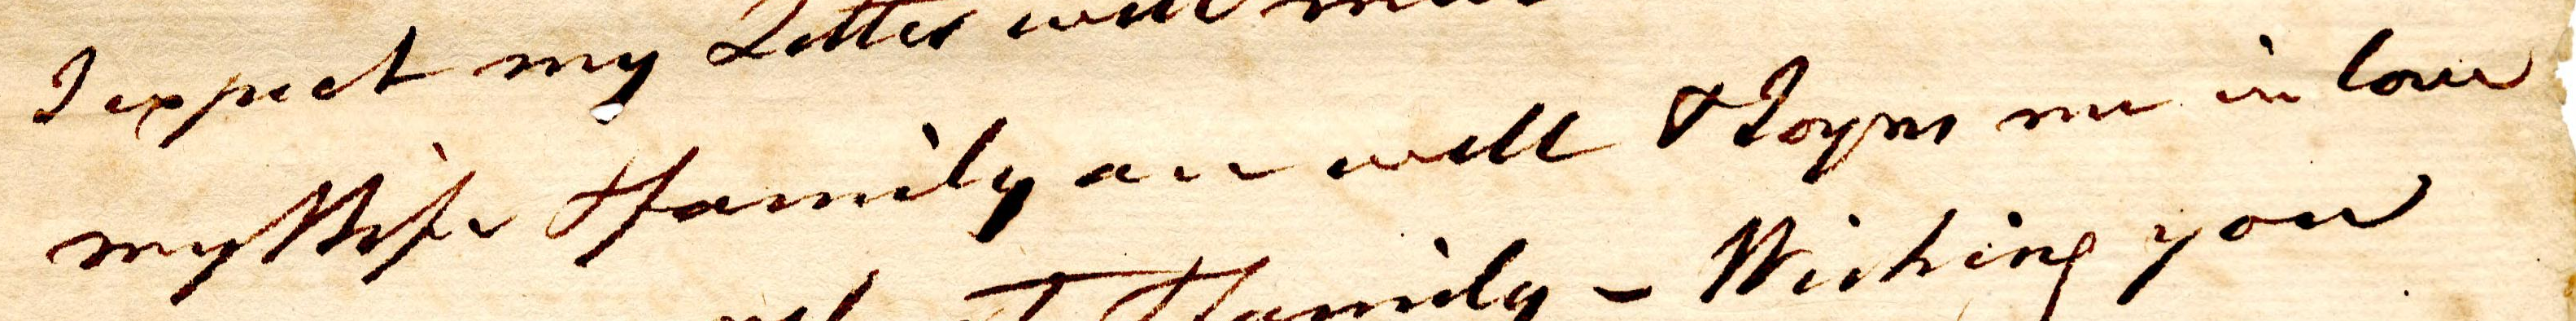my Wife & family are well & Joyns me in love
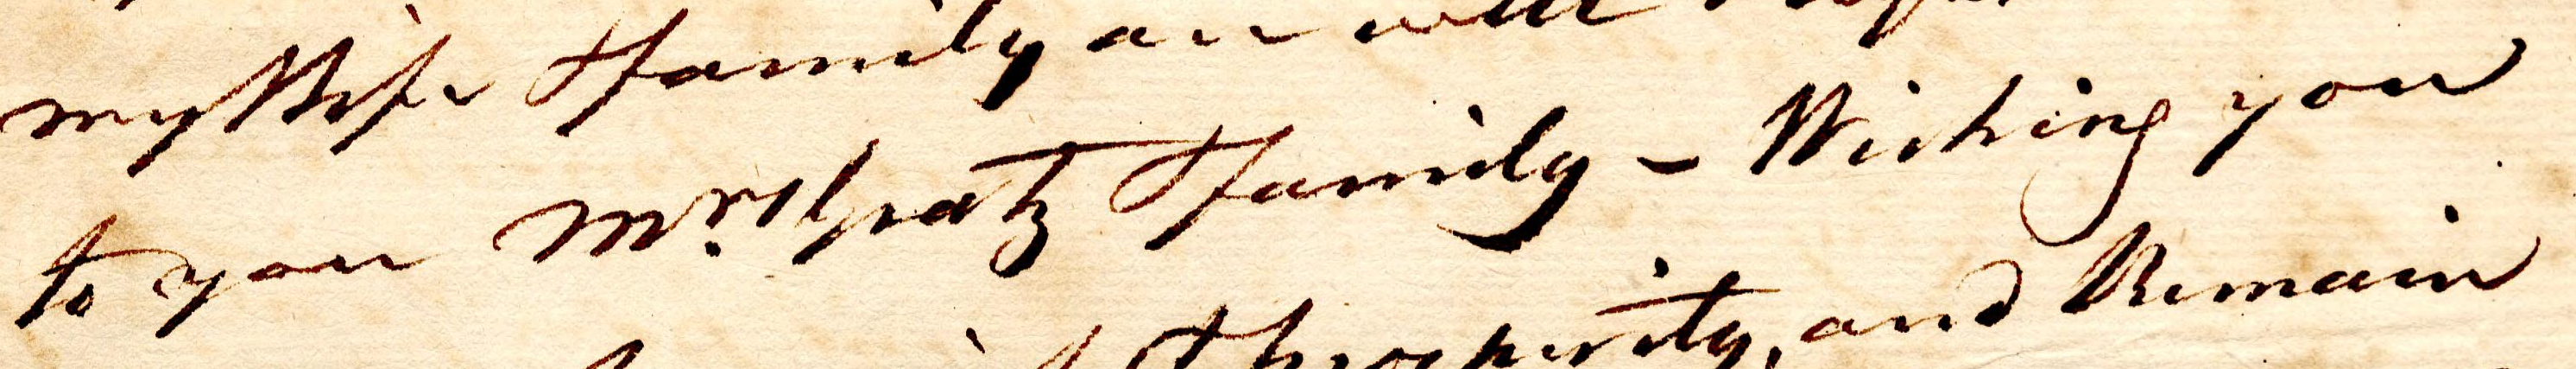to you M^rs Gratz & family- Wishing you
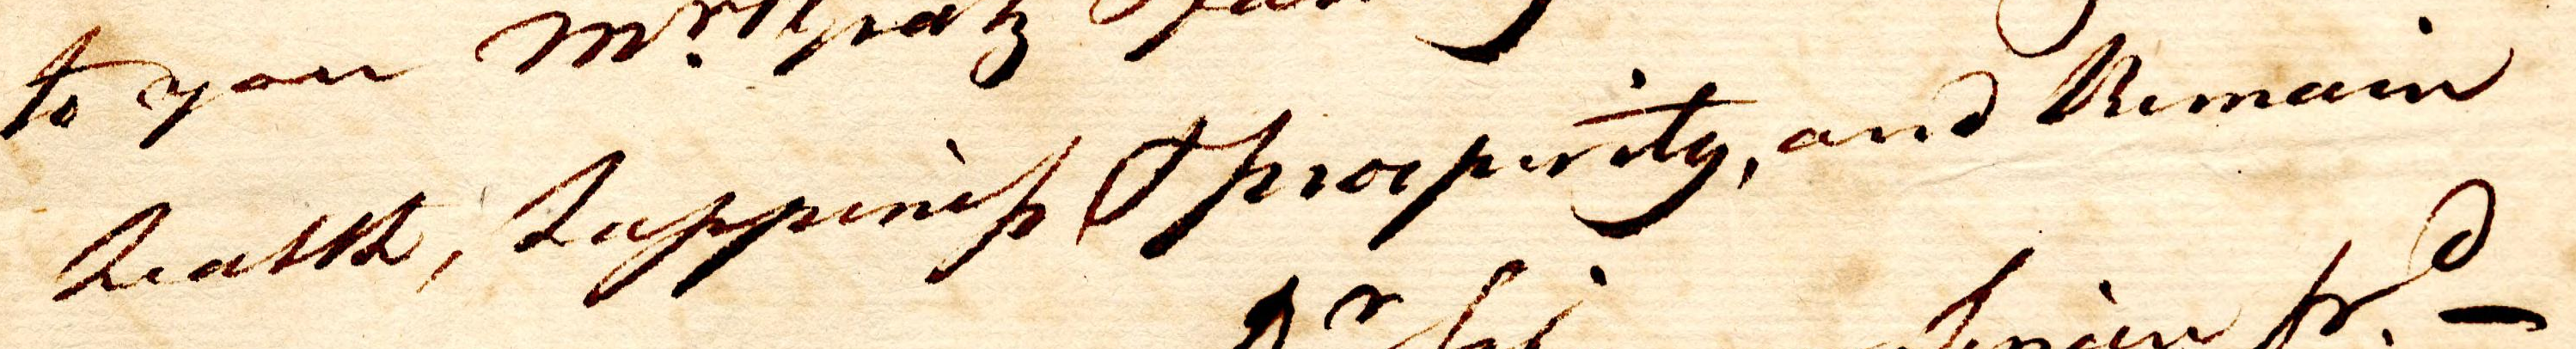health, happiness & prosperity, and Remain
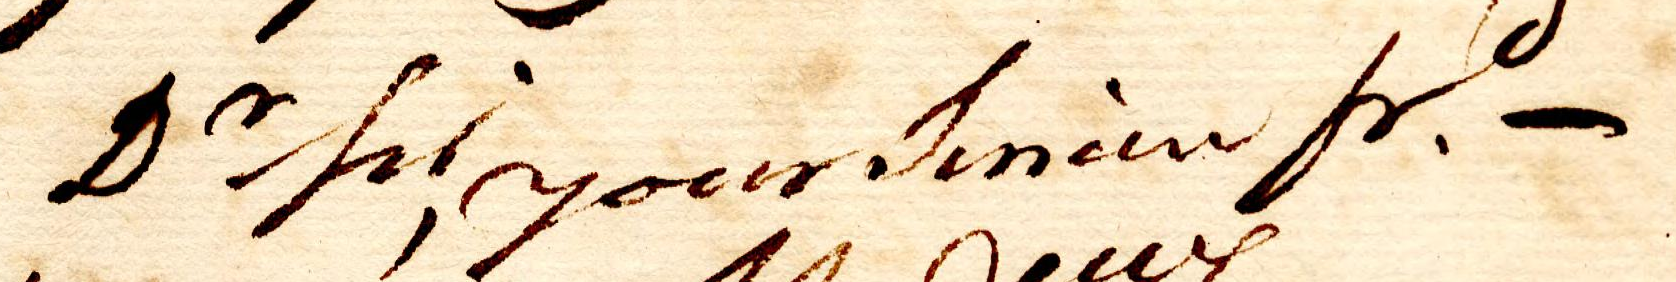D^r Sir. your sincere fr^d.-
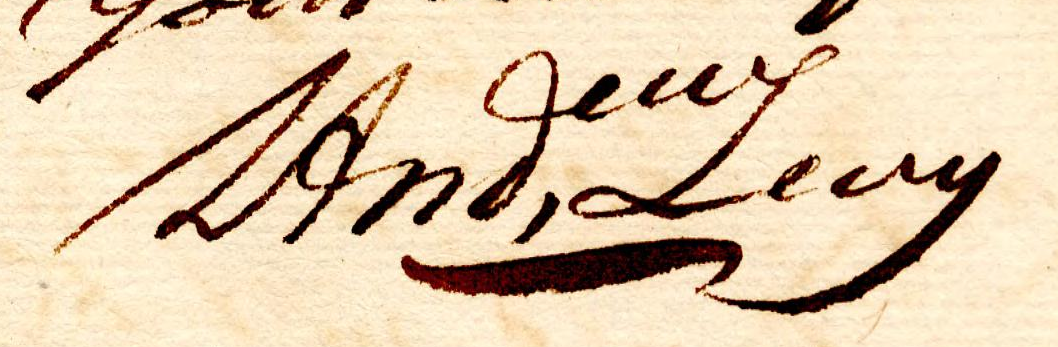And^rew Levy
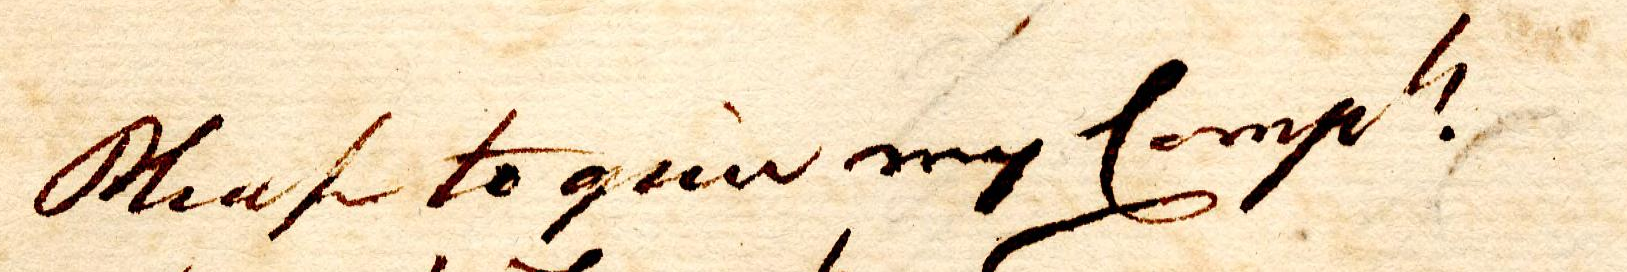Pleave to give my Comp^ts.,
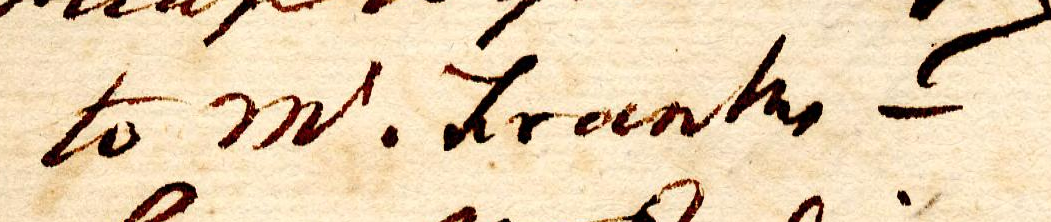to M^r. Franks-
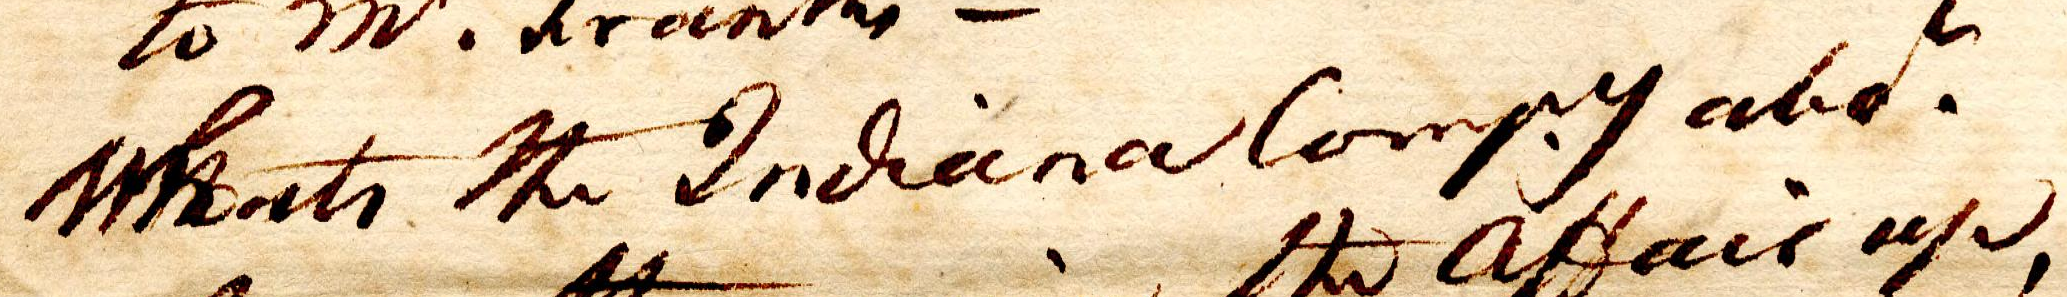Watch the Indiana Comp^y abo^t.
